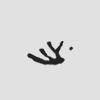出
